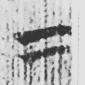二
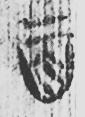百
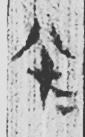八十=
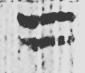二
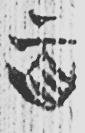百
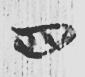四
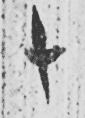十
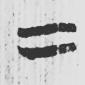二
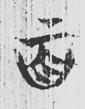百
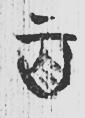百
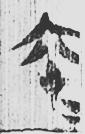六十=
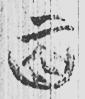百
